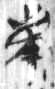民
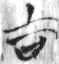吉
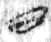日
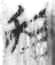利（利）
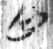㠯（以）
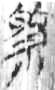祭
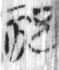祀
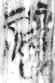禱
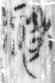○（祠）
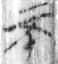不
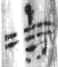吉
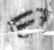日
